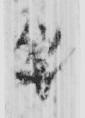{化心}
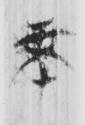不
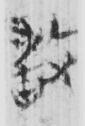敢
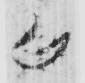㠯（以）
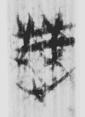憮
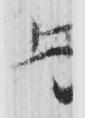上
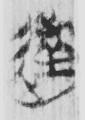{止達}
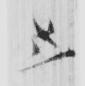之
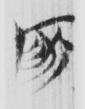所
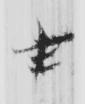才
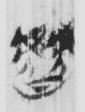{虍虍皆}
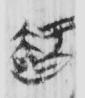智
